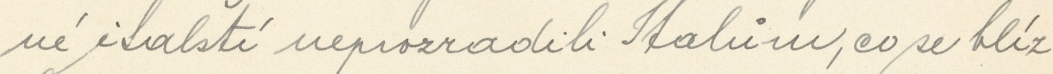né italští neprozradili Italům, co se blíz-
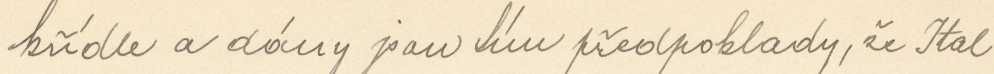křídle a dány jsou tím předpoklady, že Ital
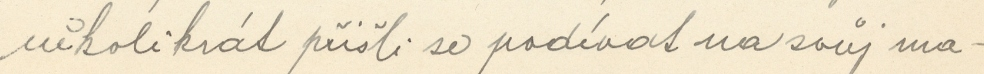několikrát přišli se podívat na svůj ma-
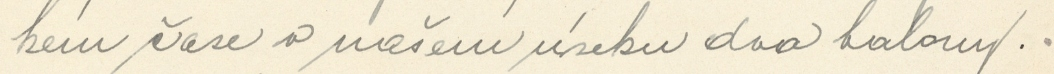kém čase v našem úseku dva balony.
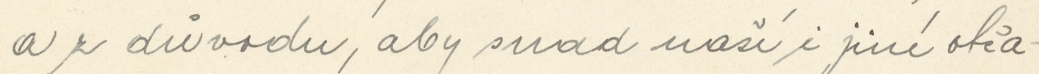a z důvodu, aby snad naší i jiní obča-
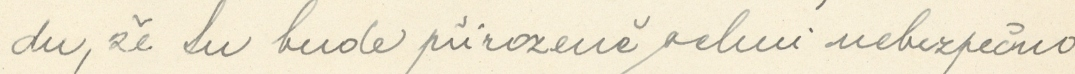du, že tu bude přirozeně velmi nebezpečno
